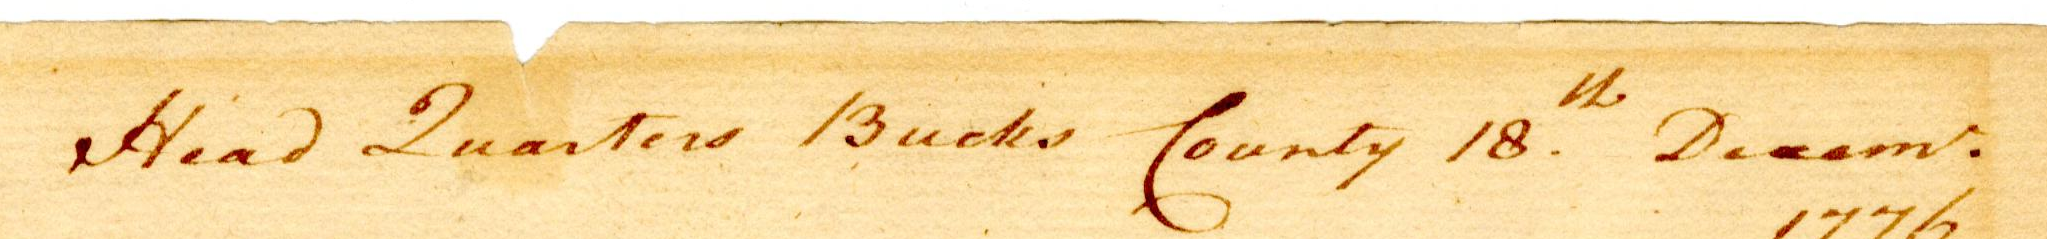Head Quarters Bucks County 18^th. Decem.
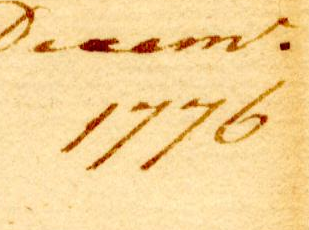1776
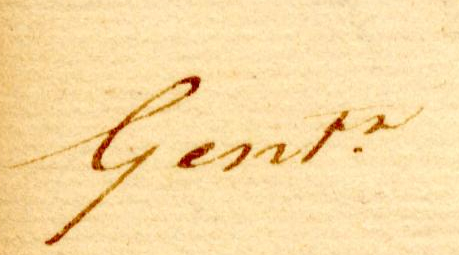Gent^n.
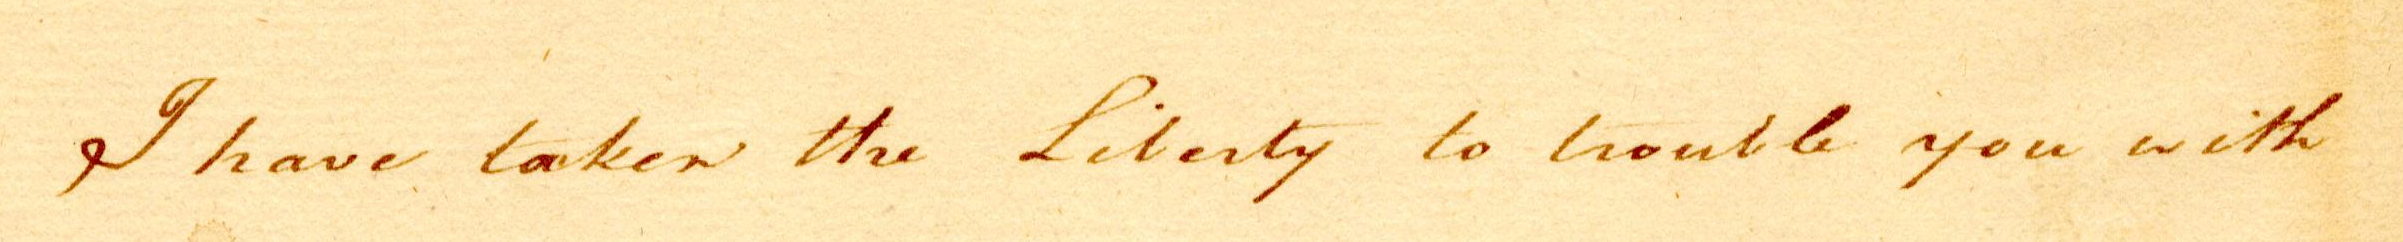I have taken the Liberty to trouble you with
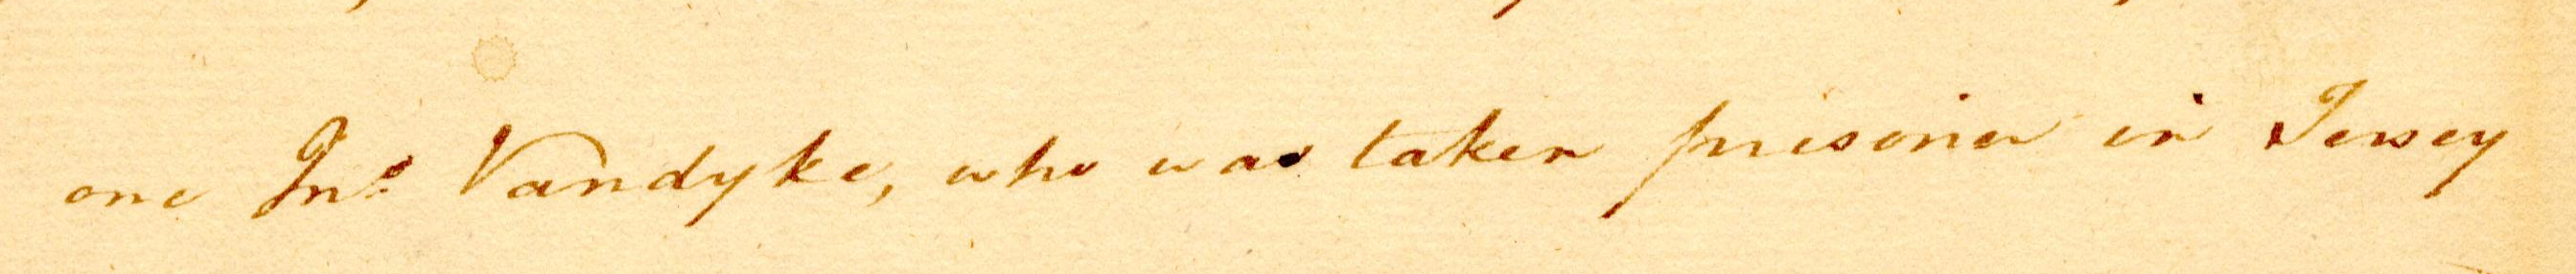one Jn^o. Vandyke, who was taken prisoner in Jersey
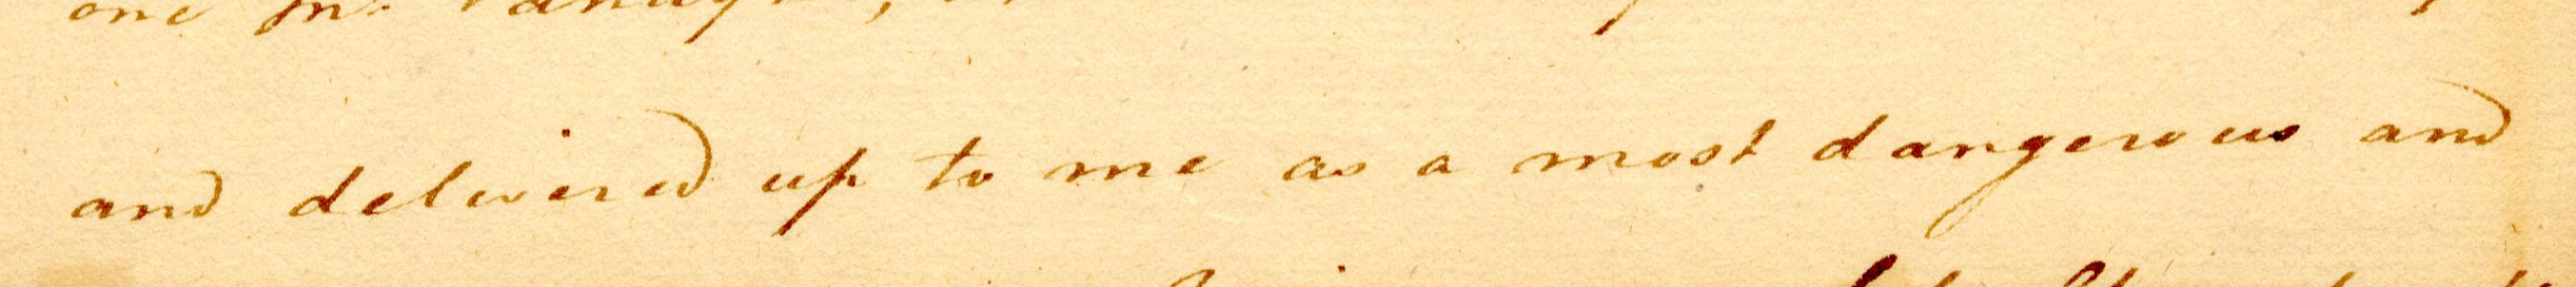and delivered up to me as a most dangerous and
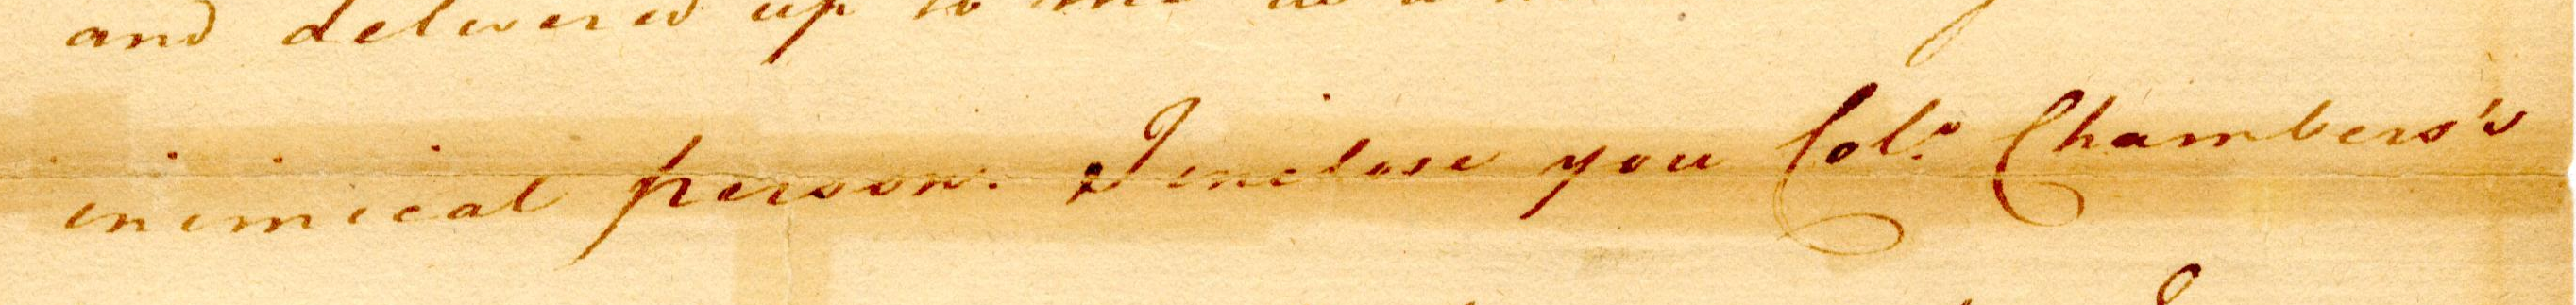inimical person. I inclose you Col^o. Chambers's
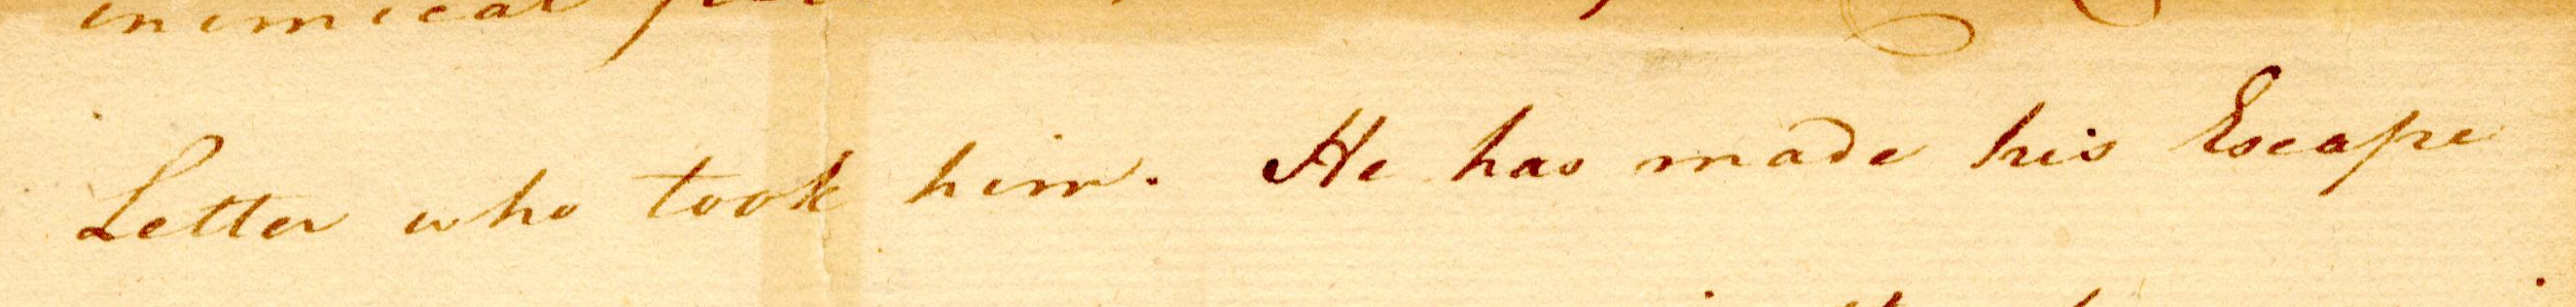Letter who took him. He has made his Escape
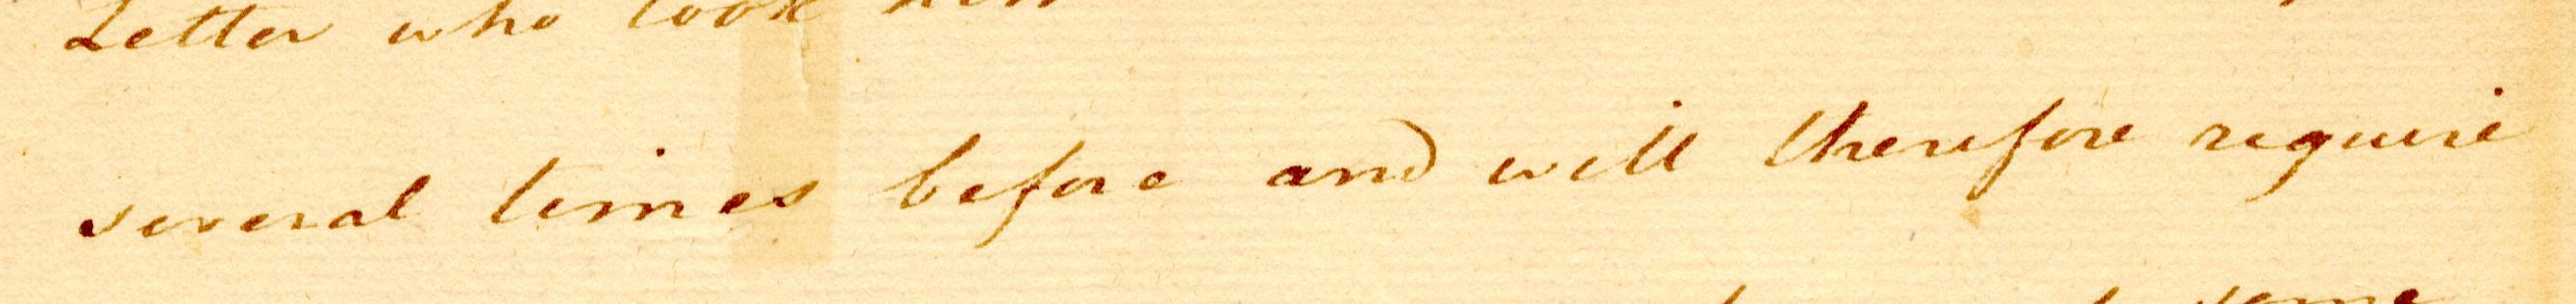several times before and will therefore require
